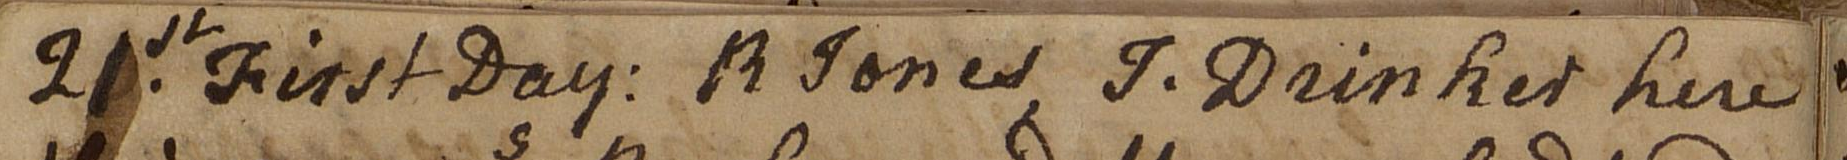21^st. First Day: R Jones, J. Drinker here
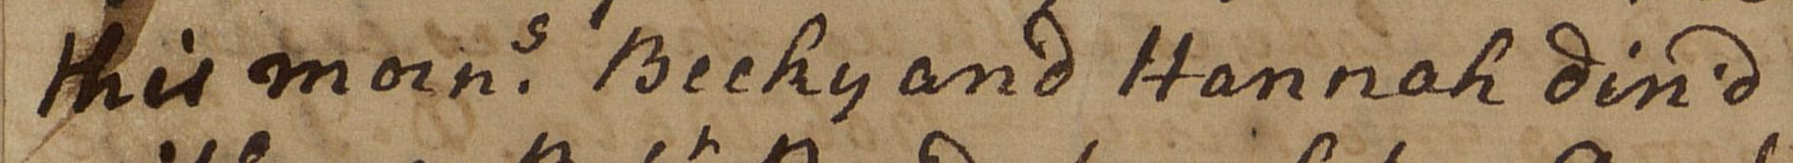this morn^g. Becky and Hannah din'd
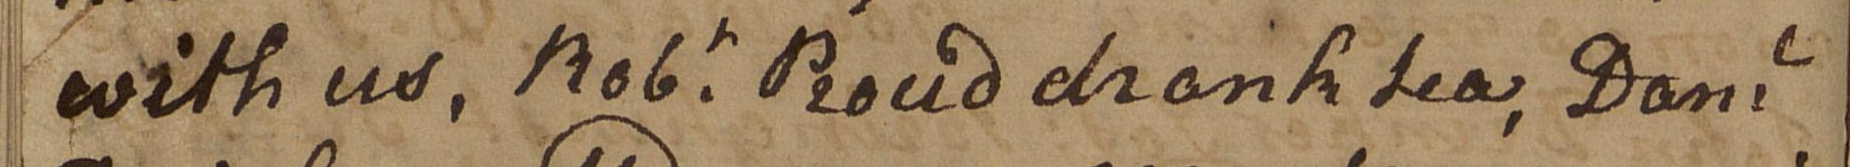with us, Rob^t. Proud drank tea, Dan^l.
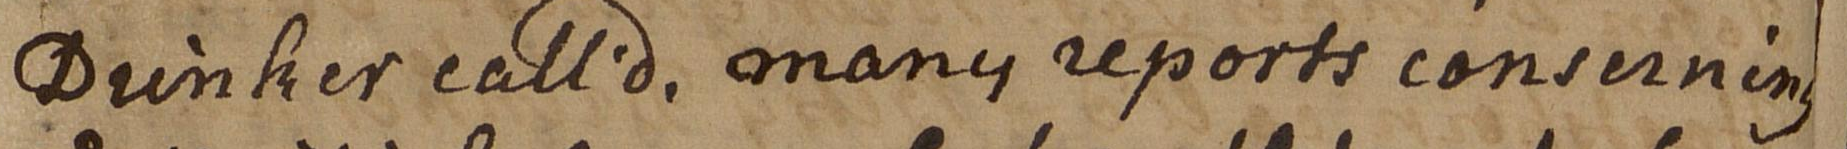Drinker call'd, many reports conserning
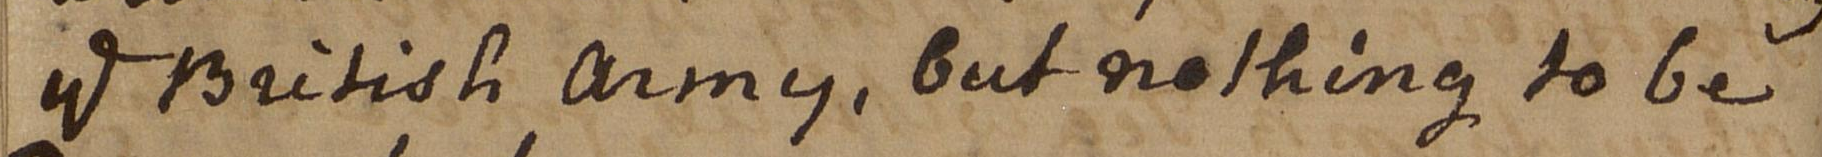y^e British army, but nothing to be
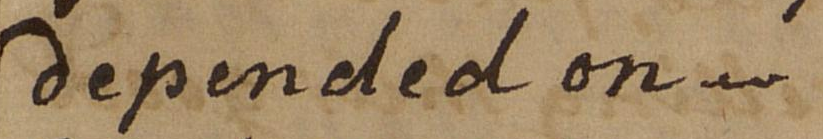depended on-
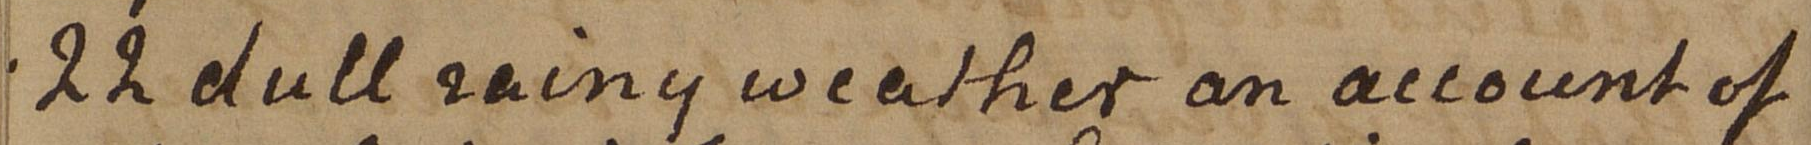22 dull rainy weather an account of
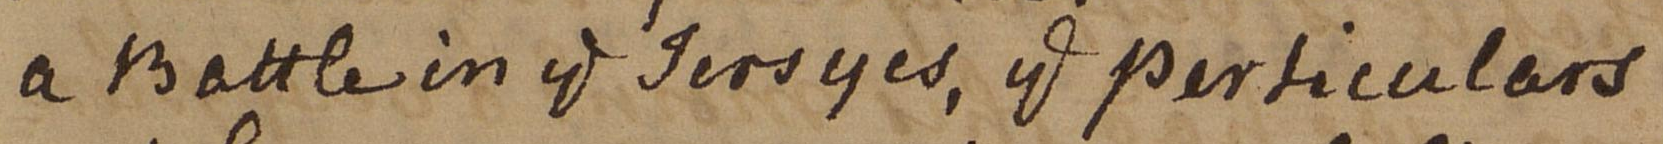a Battle in y^e Jersyes, y^e perticulars
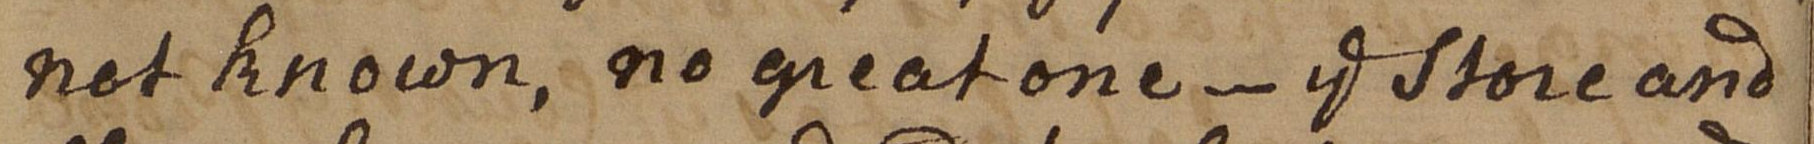not known, no great one- y^e Store and
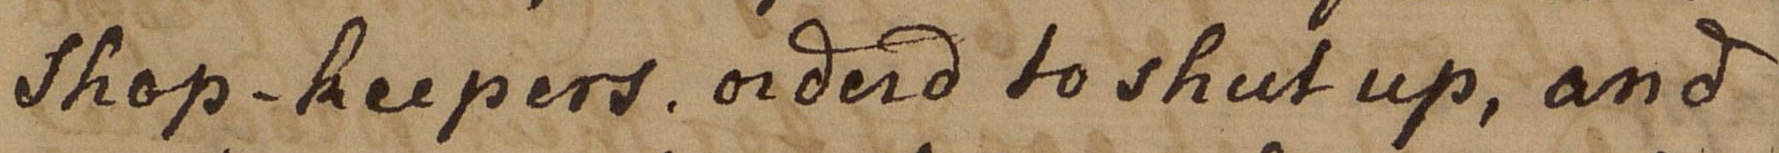Shop- keepers. orderd to shut up, and
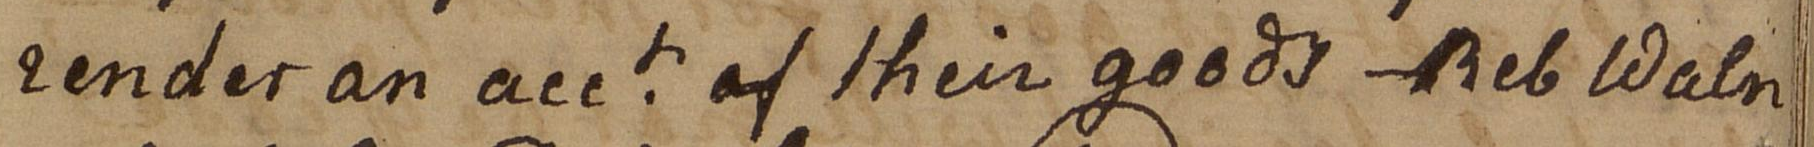render an acc^t. of their goods- Reb Waln
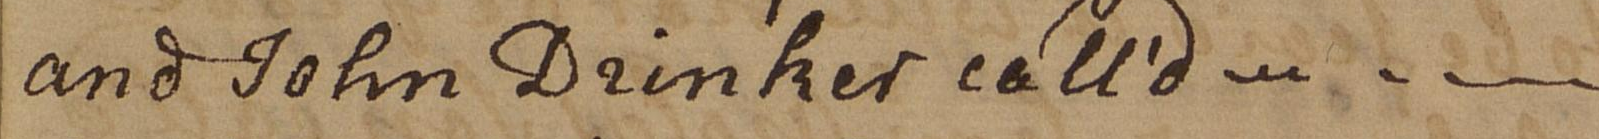and John Drinker call'd --
